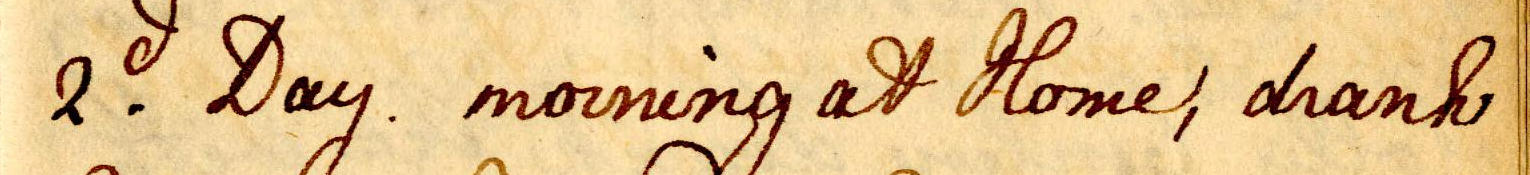2^d Day. morning at Home, drank
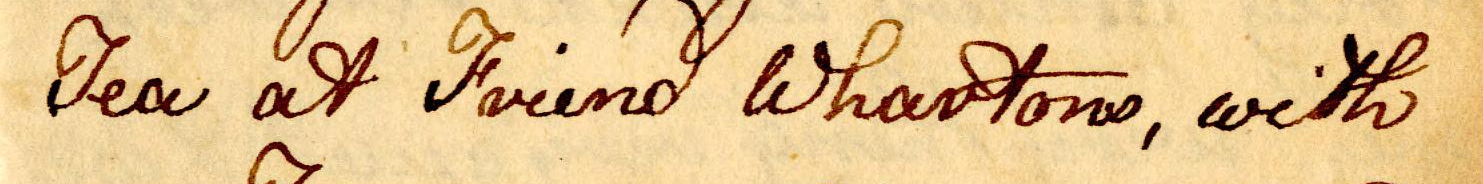Tea at Friend Whartons, with
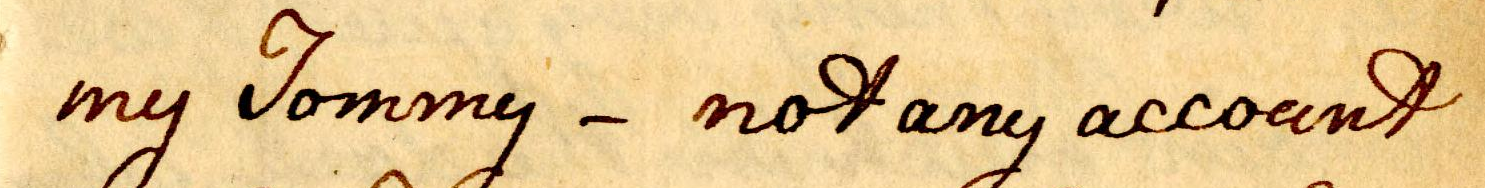my Tommy- not any account
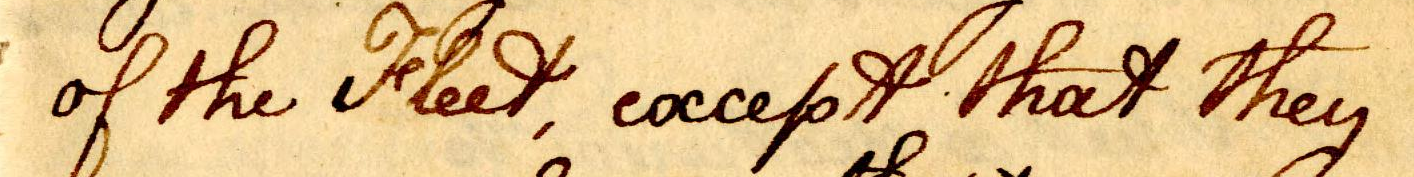of the Fleet, except that they
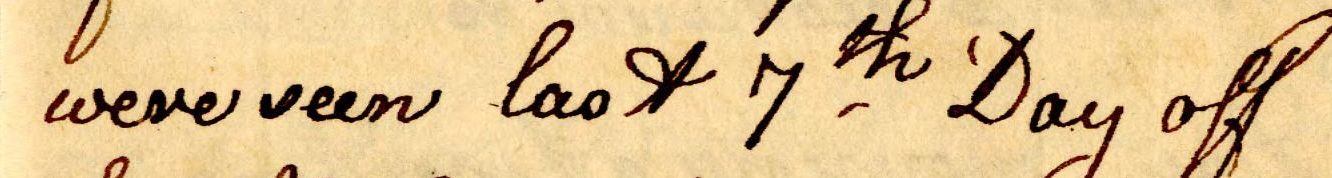were seen last 7^th Day off
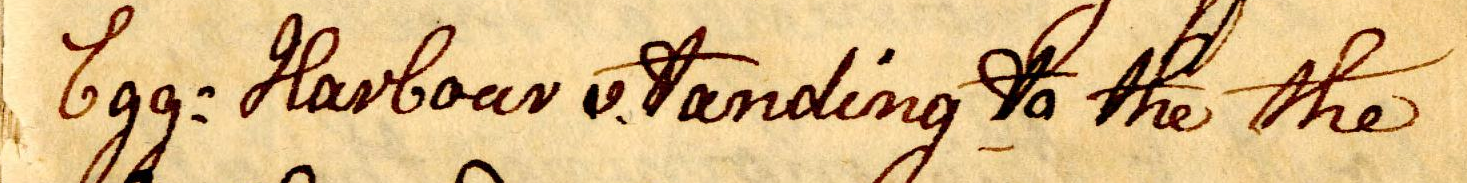Egg-Harbour standing to the the
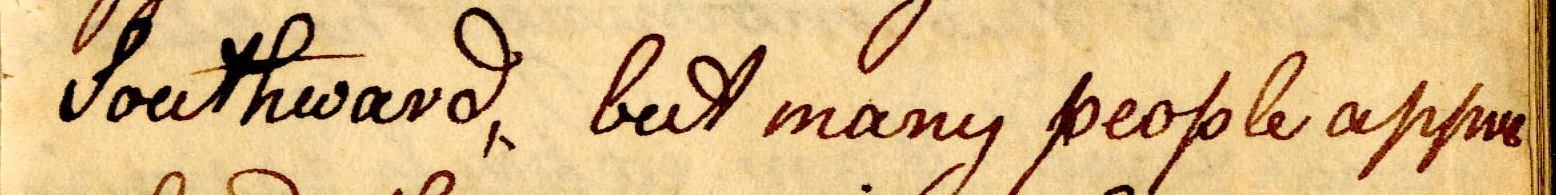Southward, but many people appre
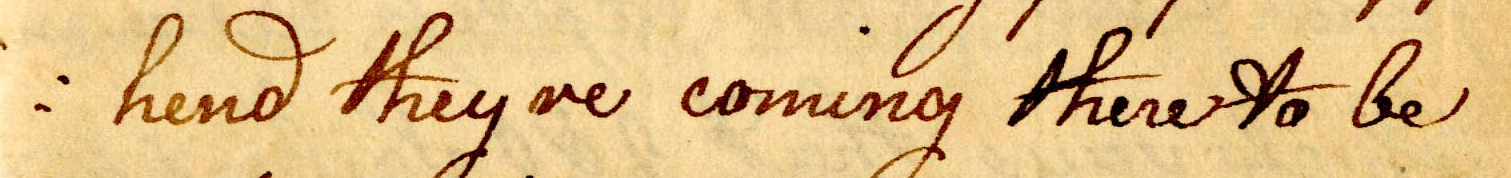-hend they re coming there to be
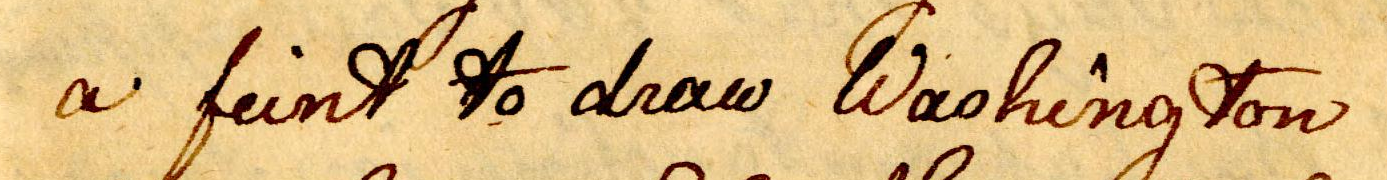a feint to draw Washington
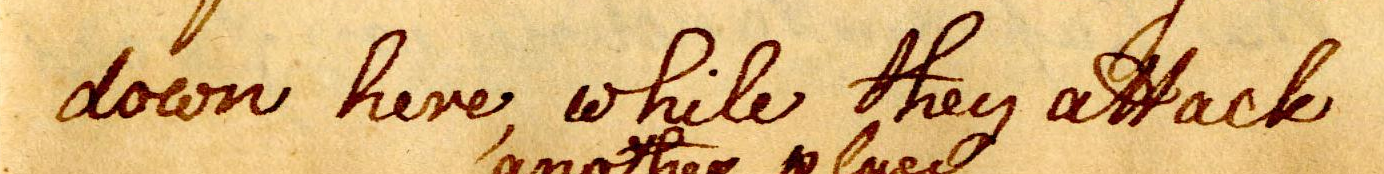down here, while they attack
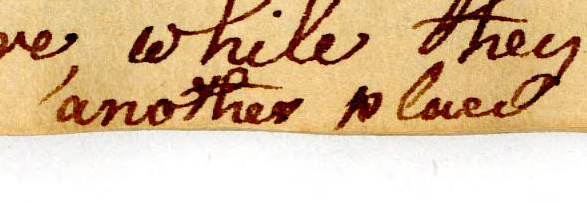another place
